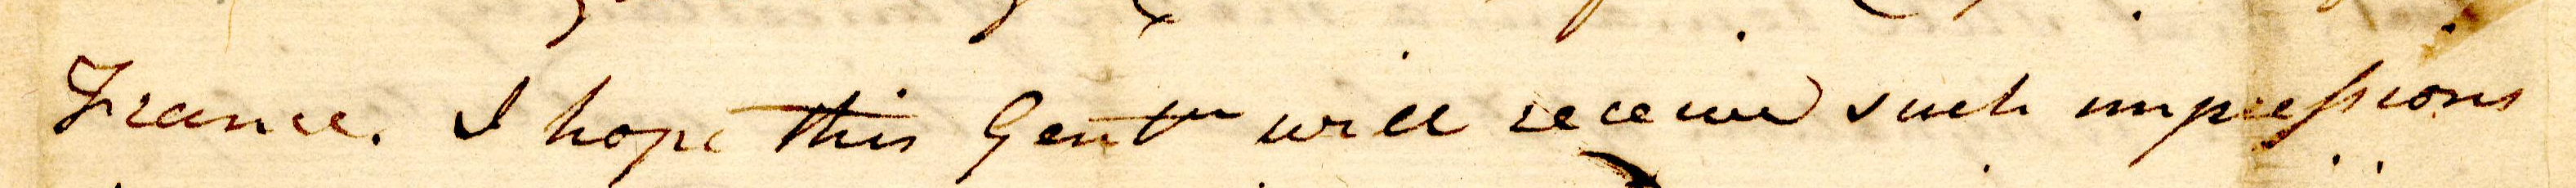France. I hope this Gent^n will receive such impressions
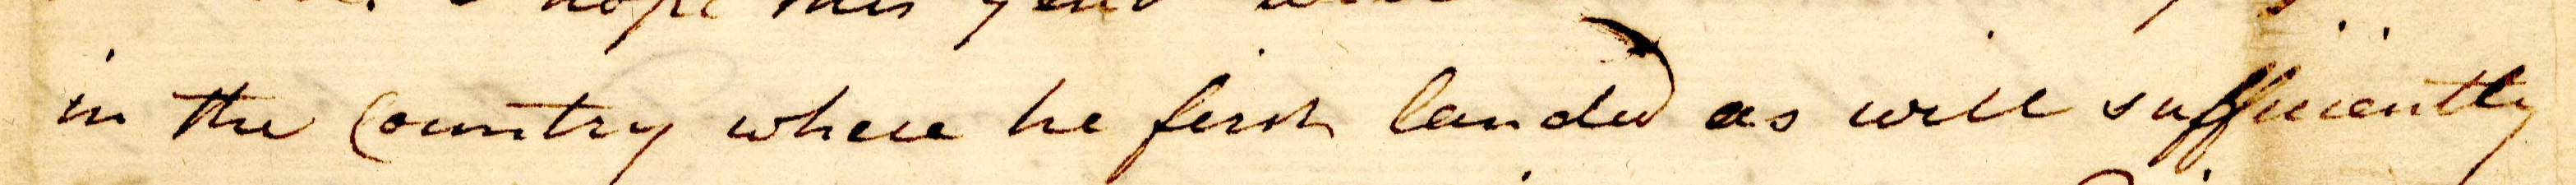in the Country where he first landed as will sufficiently
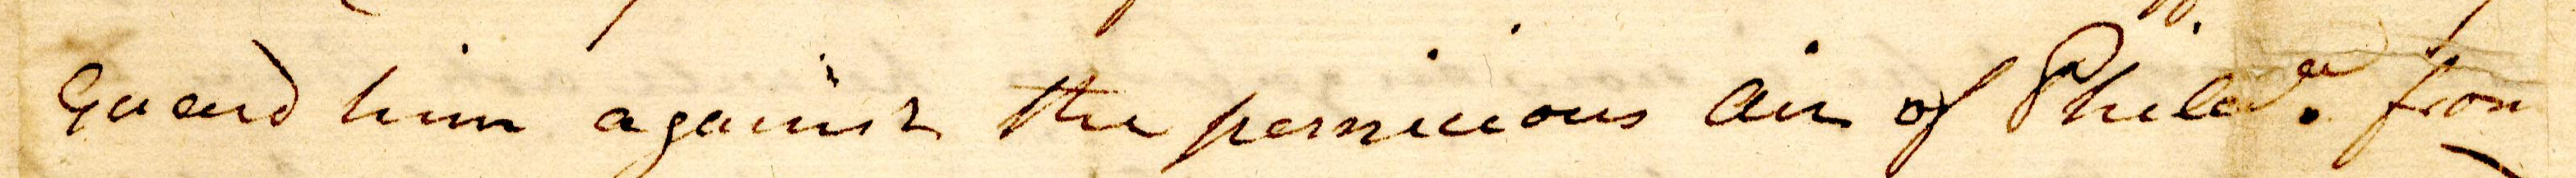Guard him against the pernicious air of Phila^a. from
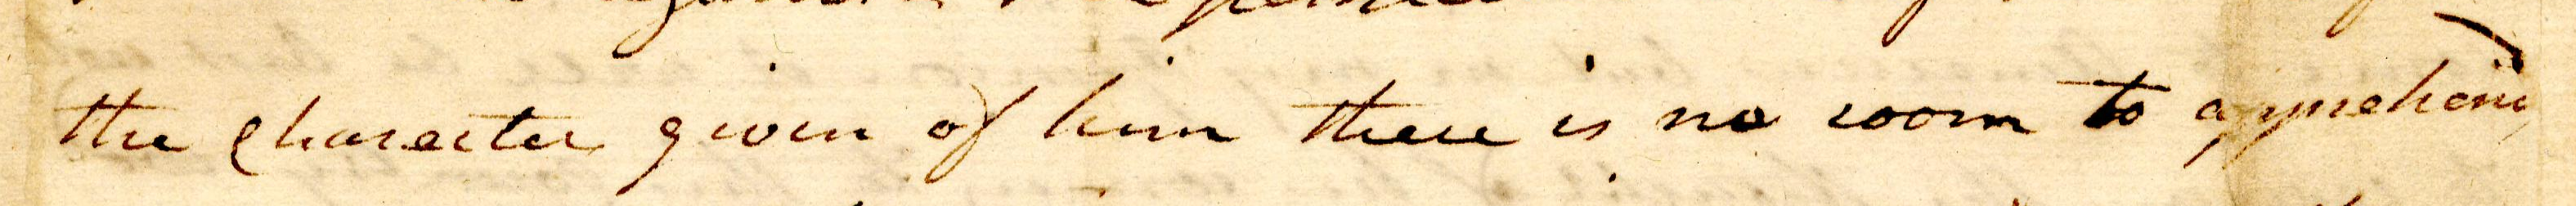the character given of him there is no course to apprehend
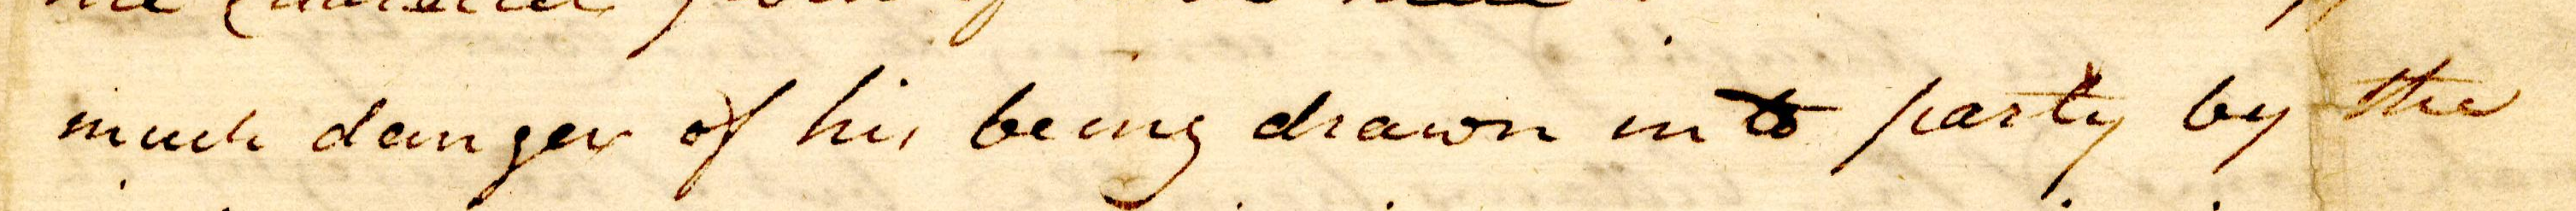much danger of his being drawn in to party by the
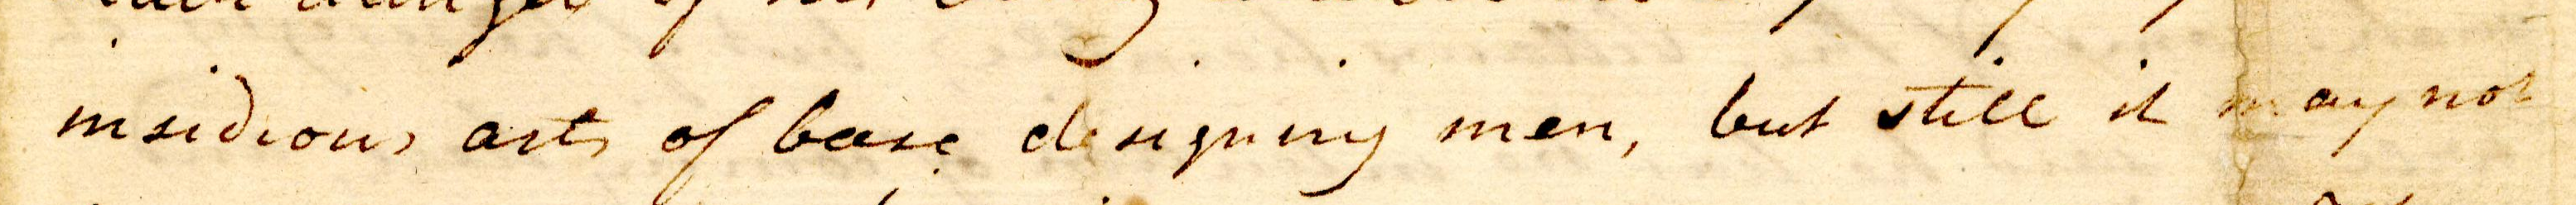insidious art of care ordinary men, but still it may not
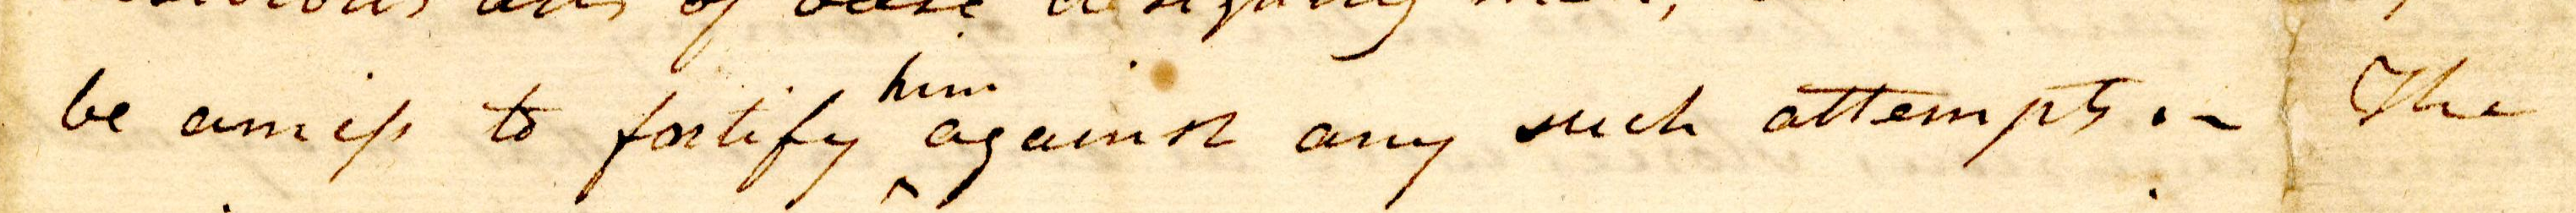be amiss to fortify ^ against any such attempts.- The
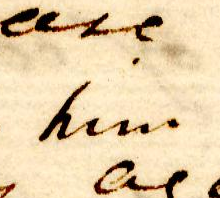him
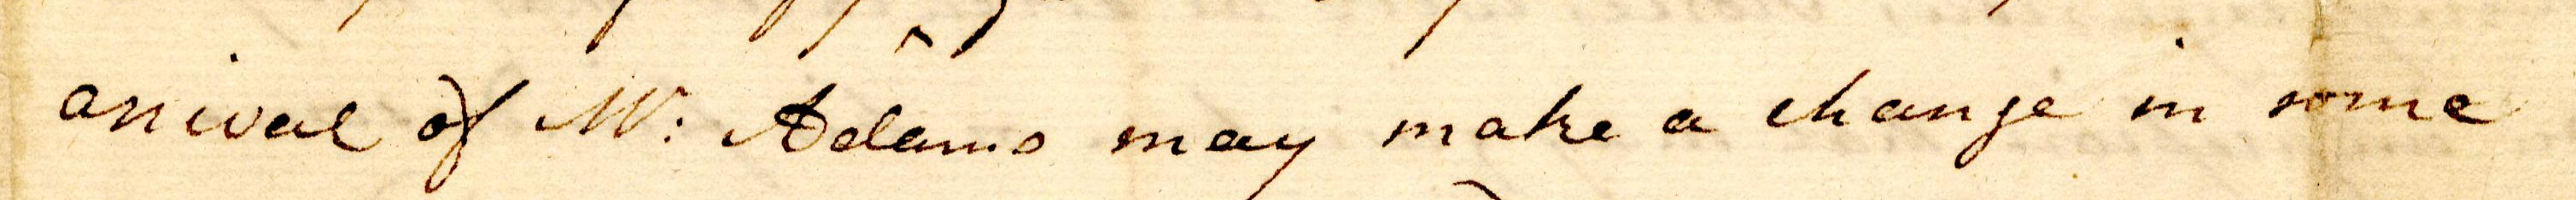arrival of M^r: Adams may make a change in some
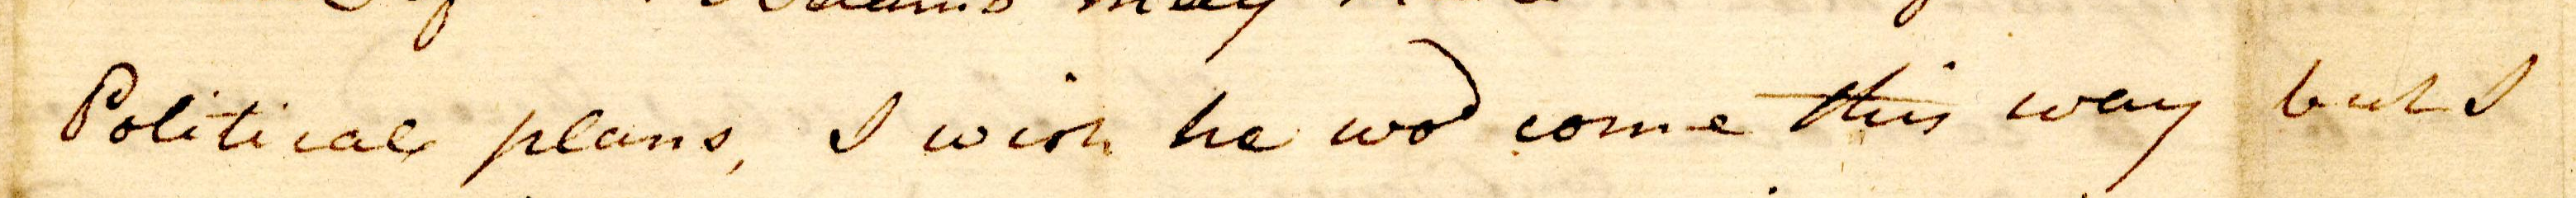Political plans, I wish he wo^d come this way but I
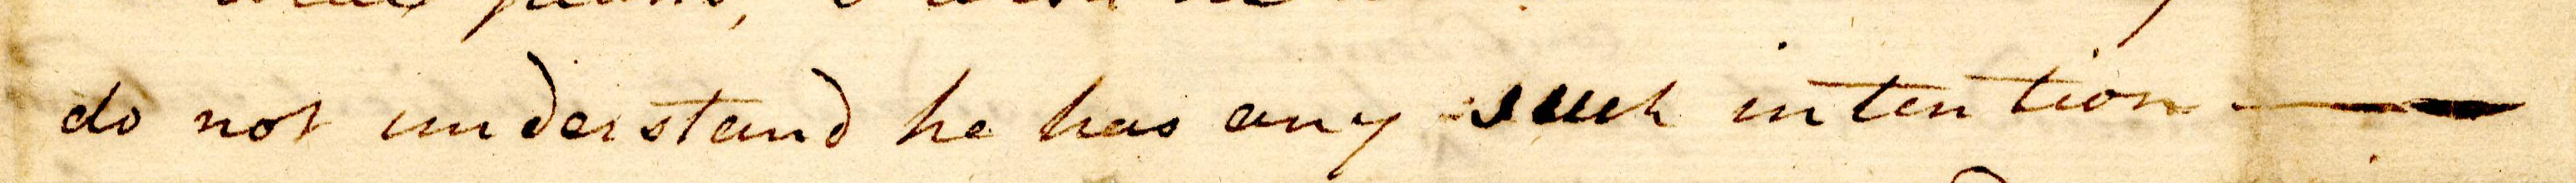do not understand he has any such intention-
